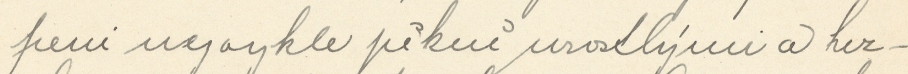peni nezvykle pěkně urostlými a hez-
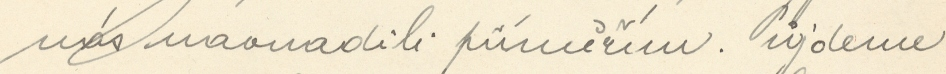nás navnadili příměřím. Půjdeme
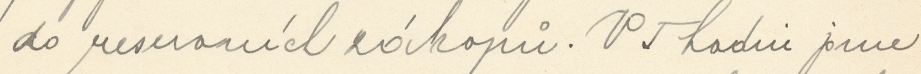do reservních zákopů. V 5 hodin jsme
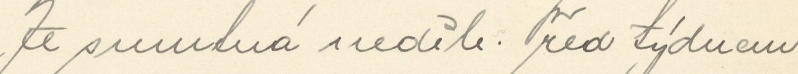Je smutná neděle. Před týdnem
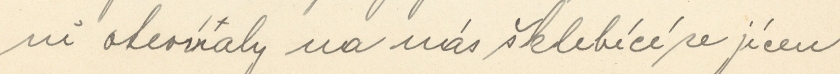ně otevíraly na nás šklebící se jícen
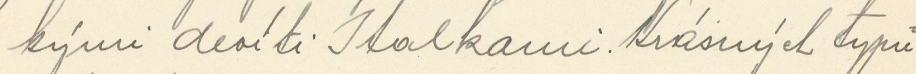kými devíti Italkami. Krásných typů
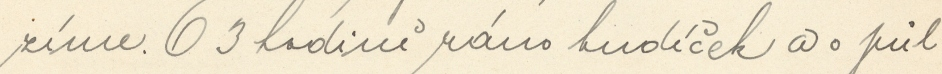zíme. O 3 hodině ráno budíček a o půl
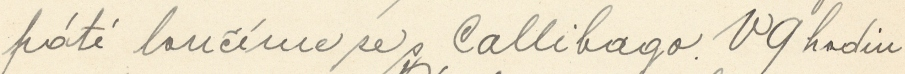páté loučíme se s Callibago. V 9 hodin
